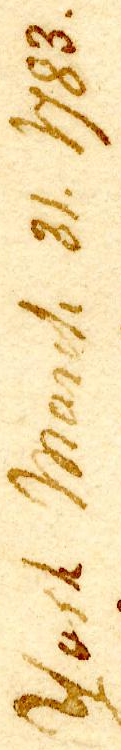York March 31. 1783.
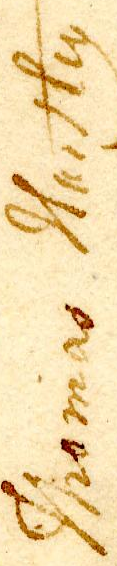Thomas Hartley
